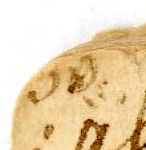30
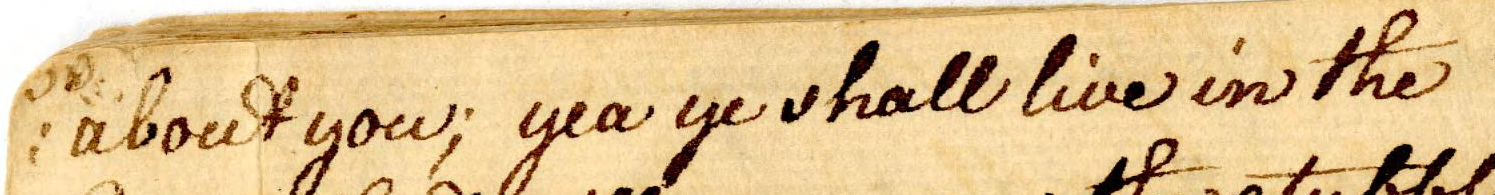"about you; yea ye shall live in the
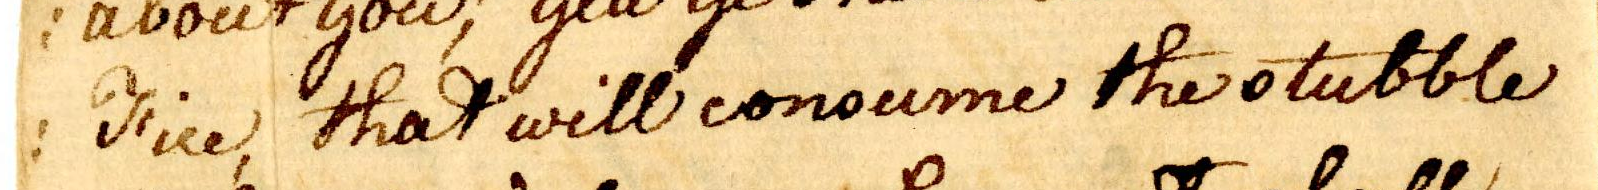"Fire, that will consume the stubble
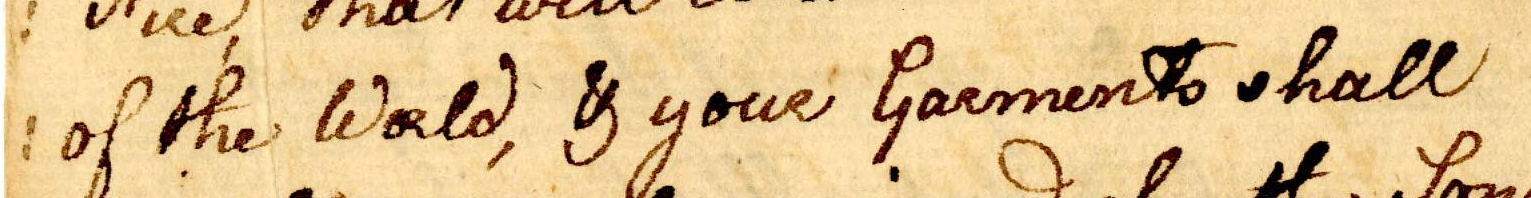"of the World & your Garments shall
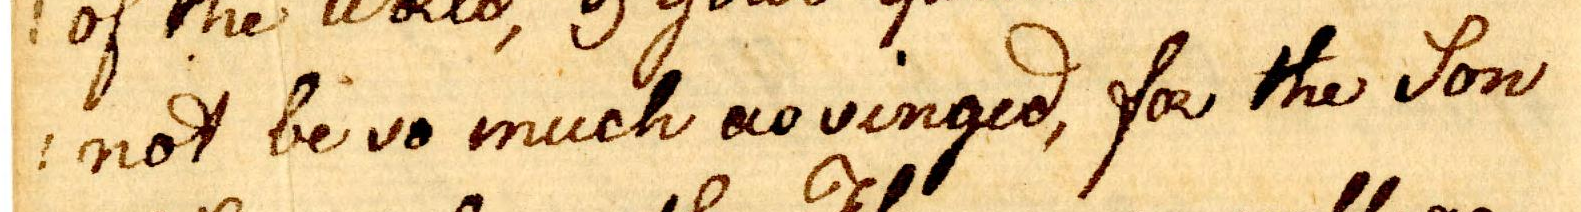"not be so much as singed, for the Son
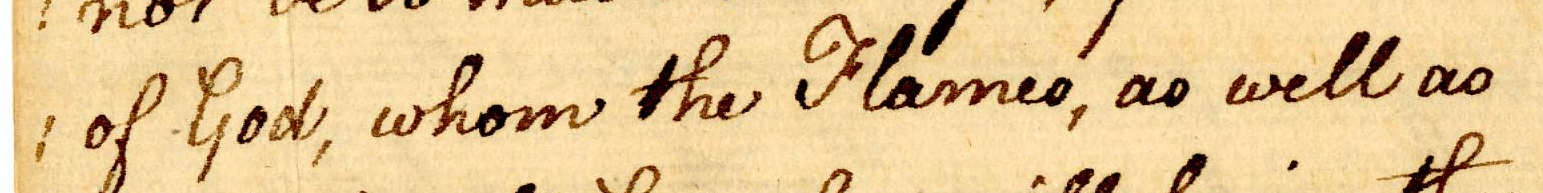"of God, whom the Flames, as well as
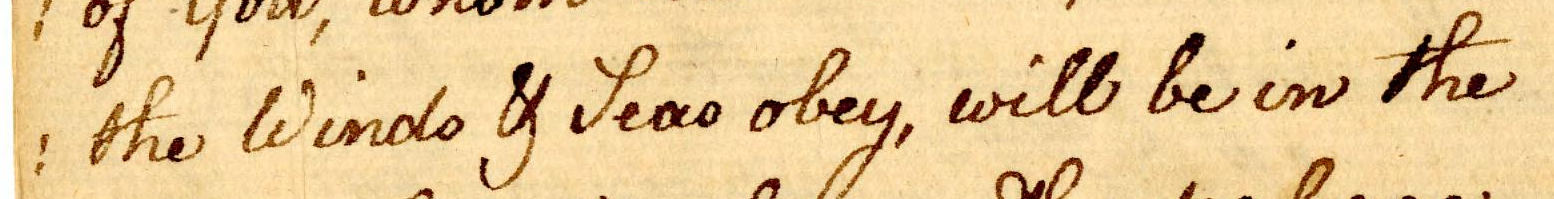"the Winds & Seas obey, will be in the
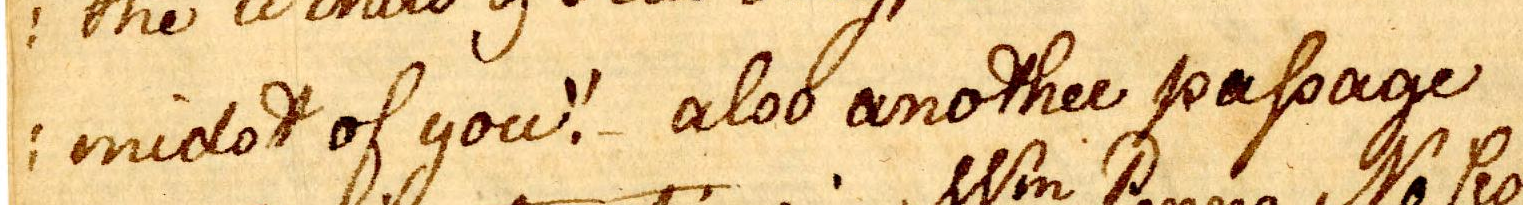"midst of you!- also another passage
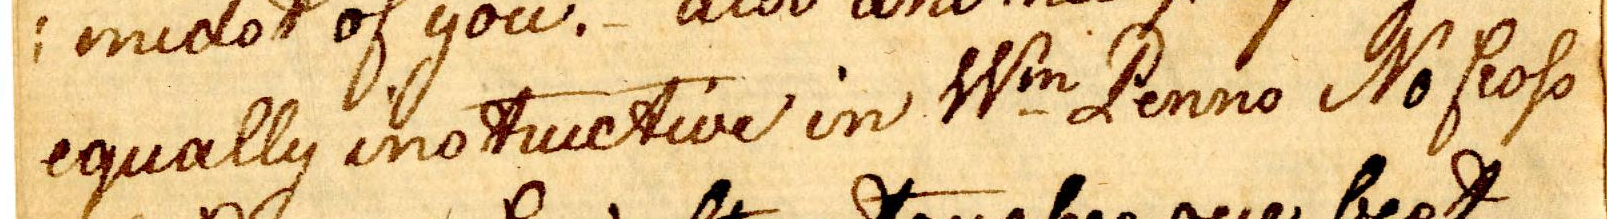equally instructive in W^m Penns No Cross
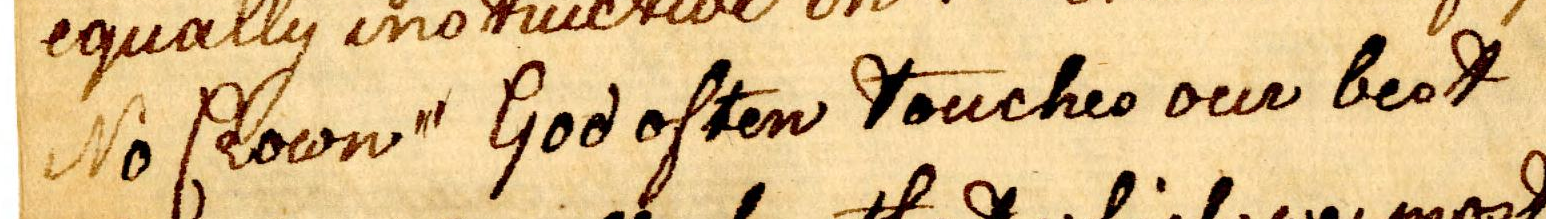No Crown "God often touches our best
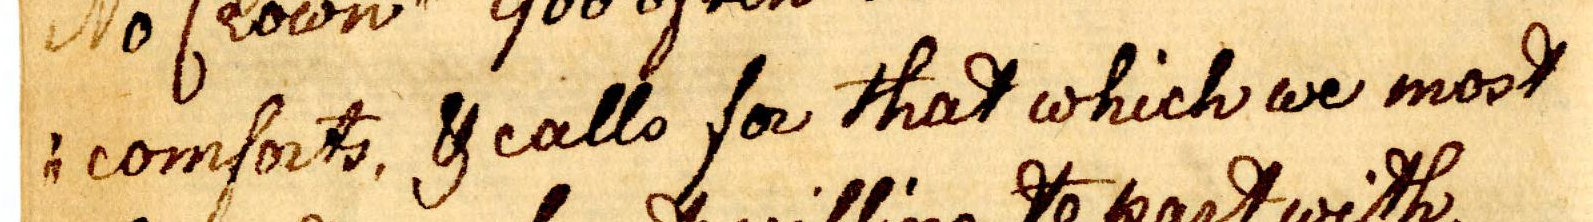"comforts, & calls for that which we most
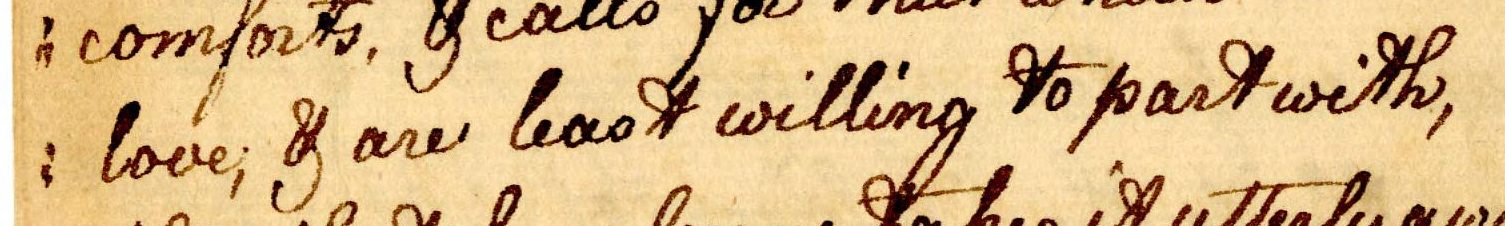"love, & are least willing to part with
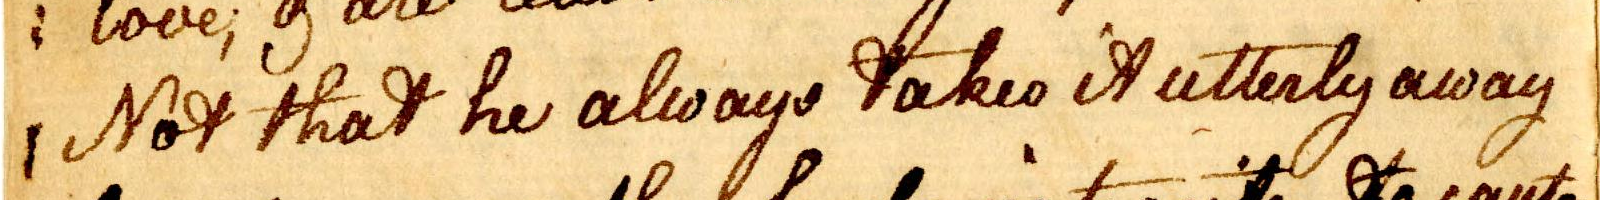"Not that he always takes it utterly away
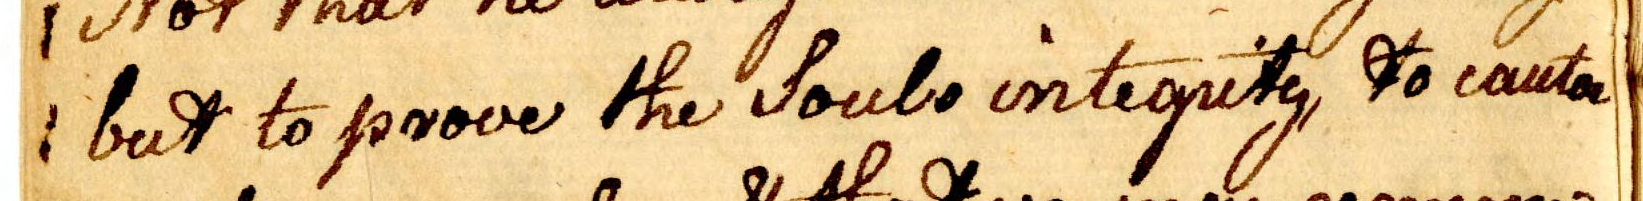"but to prove the Souls integrity, to cauton
